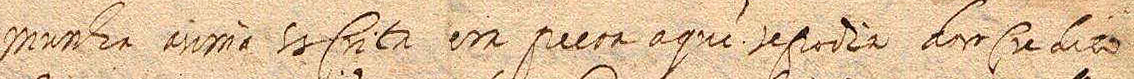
munha asima EsCrita era pecoa a quē se podia dar Credito
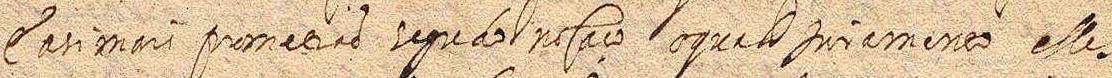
E asi mais prometiaõ segredo no Caço o qual Juramento elles
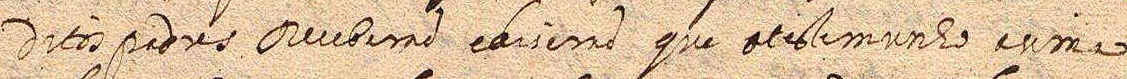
ditos padres Receberaõ e diseraõ que o testemunho asima
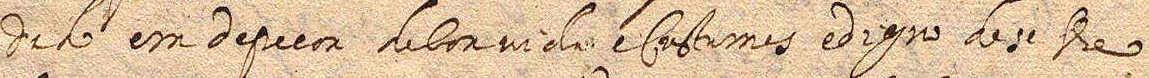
dado era de pecoa de boa uida e Custumes e digno de se lhe
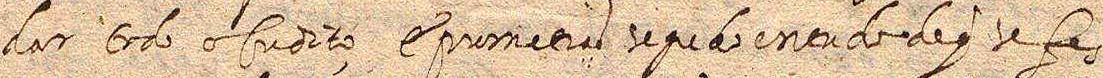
dar todo o Credito, & prometiaõ segredo en tudo de q̄ se fes
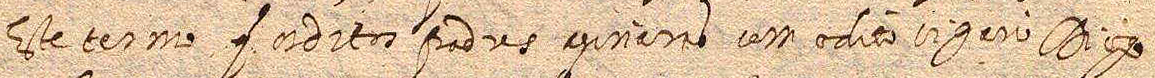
Este termo q̄ os ditos padres asinaraõ com o dito vigario Diogo
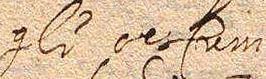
glz̄ o esCreui
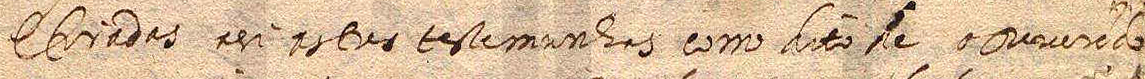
& tiradas asi as tres testemunhas como dito he o Reuerēdo
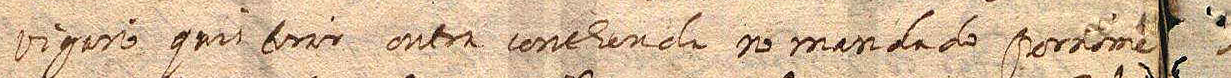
vigario quis tirar outra contheuda no mandado por nome
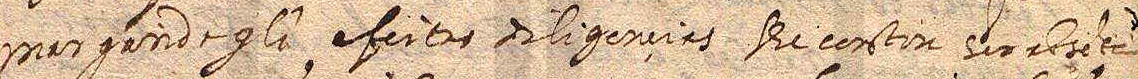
margarida glz̄ e feitas diligençias lhe constou ser absēte
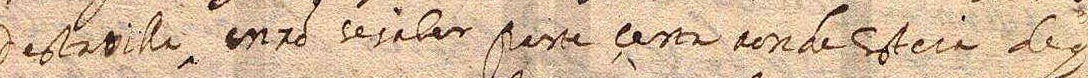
desta villa, e naõ se saber parte çerta aonde Esteia de q̄
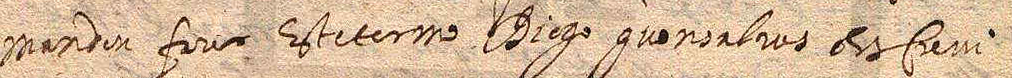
mandou fazer Este termo Diogo guonsalues o EsCreui
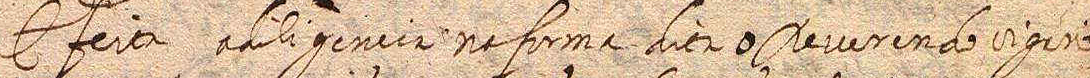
& Feita a diligencia na forma dita o Reuerendo vigario
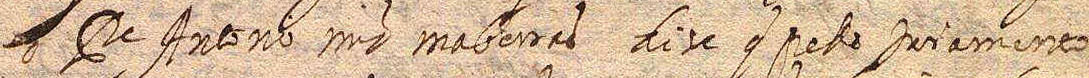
o Pe Antonio miz̄ maborraõ dise q̄ pello Juramento
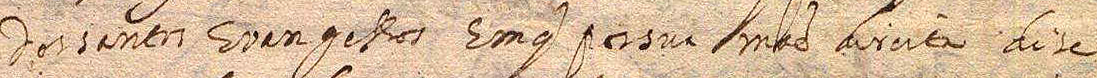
dos santos Evangelhos Em q̄ pos sua maõ direita dise
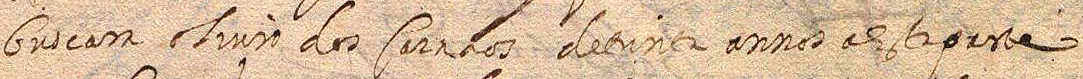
buscara o liuro dos Cazados de trinta annos a Esta parte
